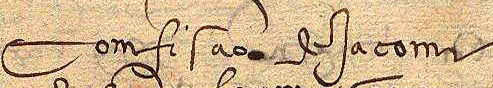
Comfisāo de Jacome
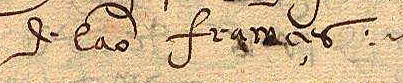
delão framçes.
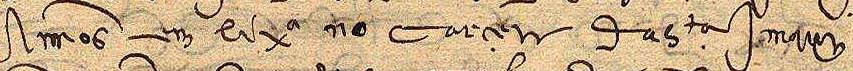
Ann̄os em lixa no carçere da sta Jmquy
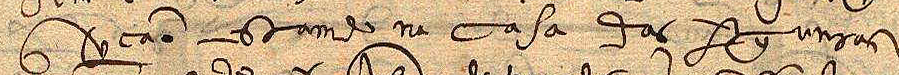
sycaõ estamdo na casa das ꝑguntas
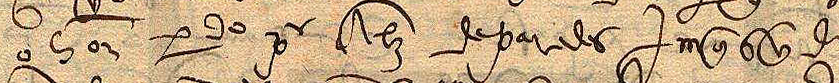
o Sōr Ldo pe Ālz de paredes Jmq̄sydor
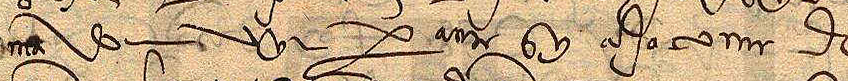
mādou vyr ꝑante sy a Jacome de
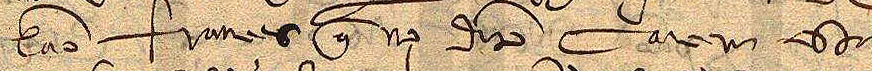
lão framçes q̄ no dito Carçere esta
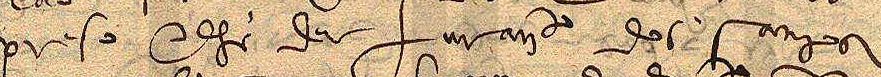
preso e lhe deu Juramto dos santos
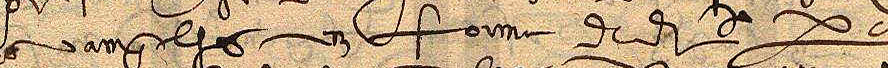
evamgelhos em forma de drto ꝑa
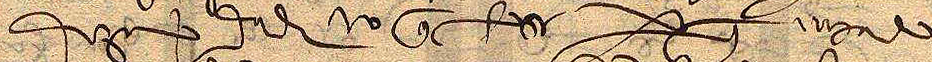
dizer ꝟdade no q̄ fose ꝑguntado
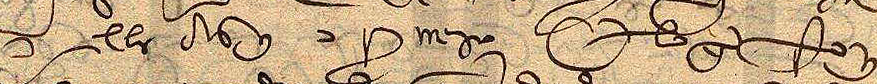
e elle Asy o ꝓmeteo E logo foy
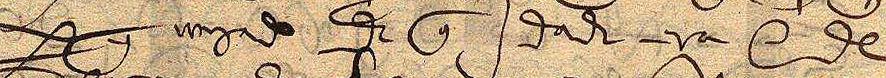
ꝑguntado de q̄ Jdade era e de
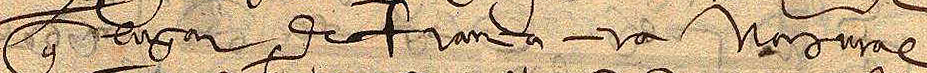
q̄ lugar de frança era natural
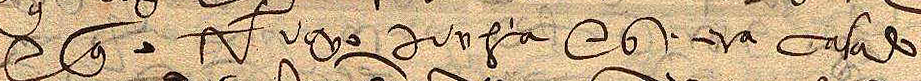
e q̄ officyo tinha e se era casado
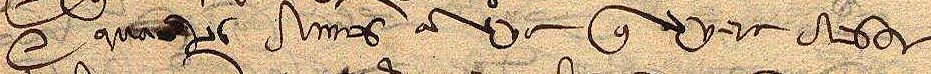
e quantos Ann̄os avya q̄ vyera A este
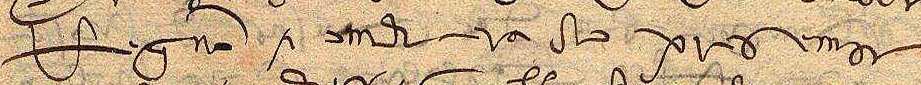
Regno e omde era Ao presemte
